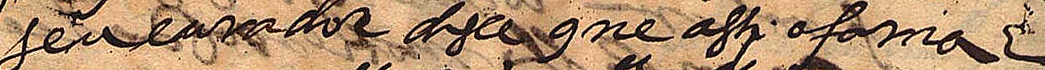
seu curador disse que assj o faria E
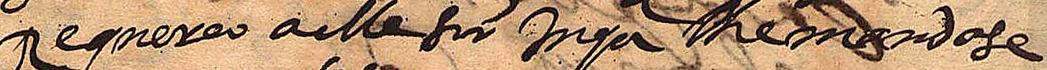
Requereo a elle sor̄ Jnqoror lhe mandase
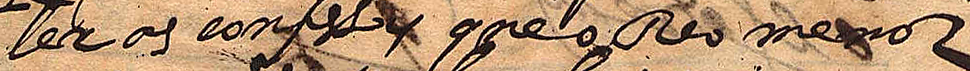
ler as confissois que o Reo menor
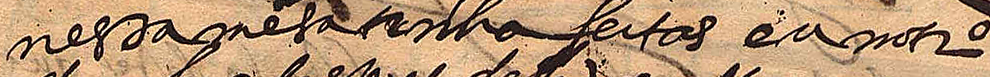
nesta mesa tinha feitas eu notro
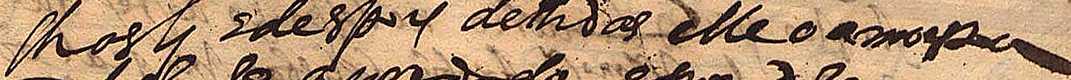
lhas lj E despois de lidas elle o amoestou
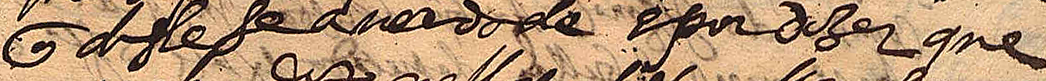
q̄ dissese a uerdade E por dizer que
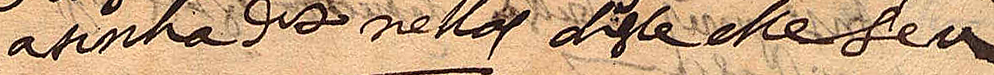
a tinha dito nellas disse elle seu
